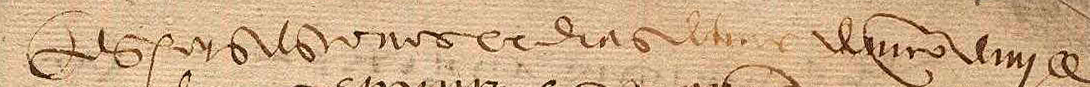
E despoys desto aos xx dias do mes de m̄ço de mjll
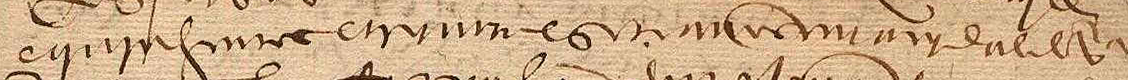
e qujnhentos e trynta e sete anos em a cydade devra
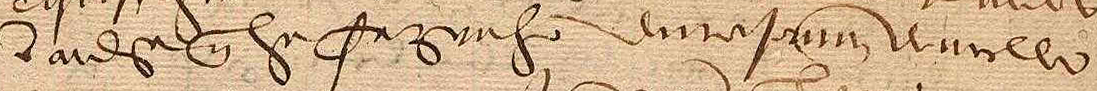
ē audja q̄ hi fazya ho doutor Joam de mello
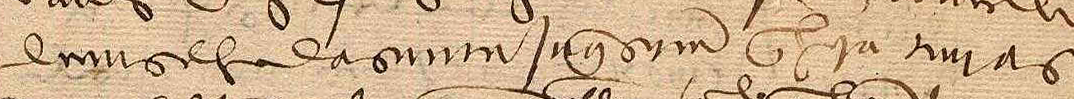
do comselho da santa Jnq̄syçā q̄ hora tem as
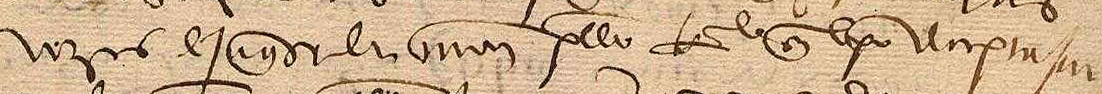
vezes de Jnq̄sydor moor p̄llo Rdo s̄r bp̄o de cepta Jm
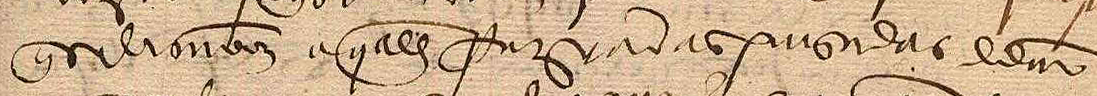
q̄sydor moor a q̄all fazya ē as pousadas do dito
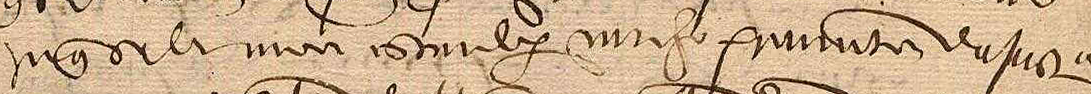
Jnq̄sydor moor estando ꝑsente ho promutor da Justa
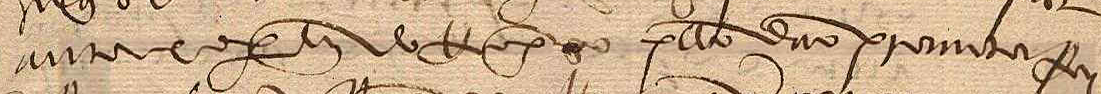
autor e o ꝑdor do Reo p̄so p̄llo dito promotor foy
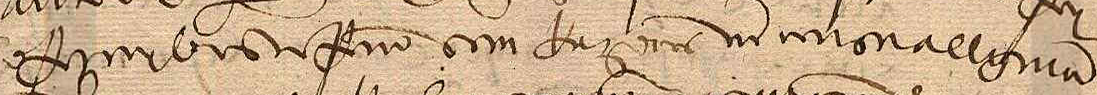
oferecydo este feito sem Razões nē cousa allgūa
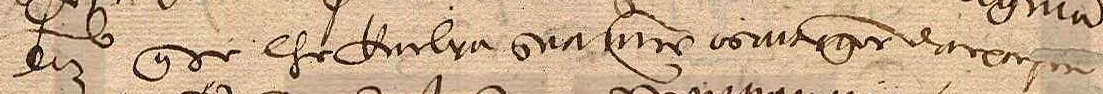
dizdo q̄ se lhe Recebya sua m̄ce os artygos da excepçā
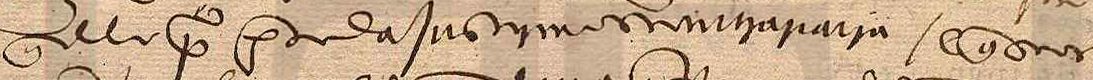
q̄ elle p̄o p̄te da Justyça os comtrariarja / e q̄ se os
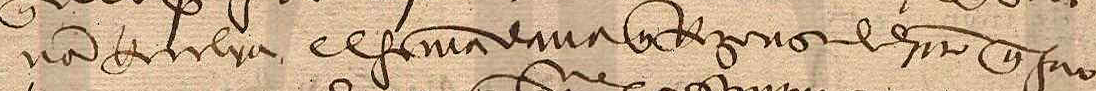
nā Recebya e lhe mādaua q̄ Rezoase de dirto q̄ hao
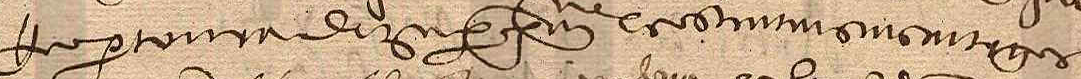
Reo ꝑtencya dizer ꝑ p̄mro e sostentar seus artygos
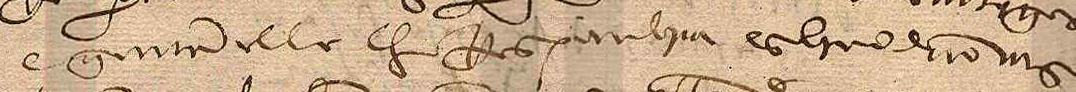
e q̄ entā elle lhe Responderia e sobre o dito caso
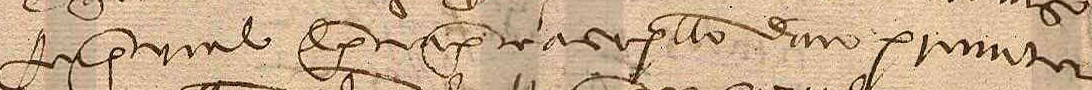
foy p̄tycado de p̄te a p̄te asy p̄llo dito promotor
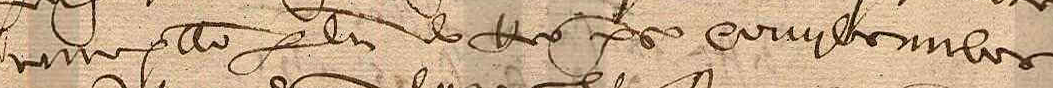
como p̄llo ꝑdor do Reo p̄so e ouujdos ambos
